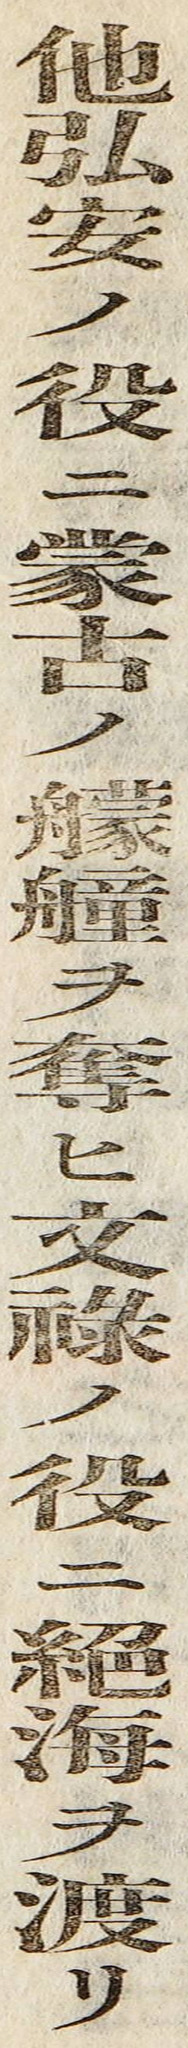他弘安ノ役ニ蒙古ノ艨艟ヲ奪ヒ文禄ノ役ニ絶海ヲ渡リ
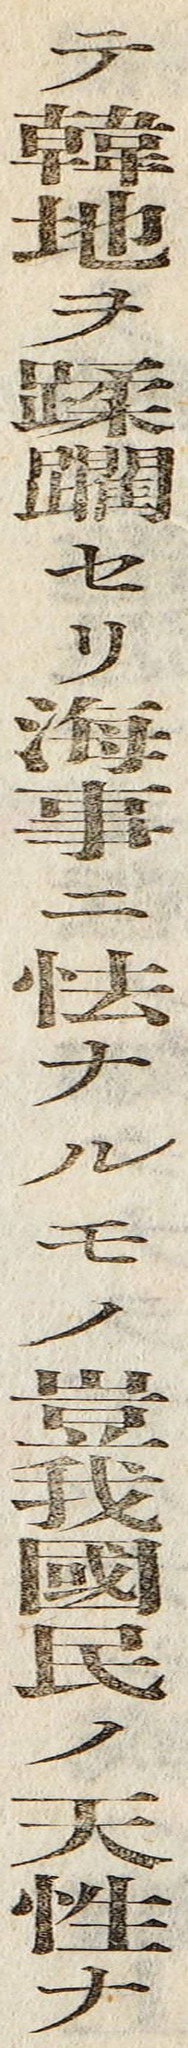テ韓地ヲ蹂躙セリ海事ニ怯ナルモノ豈我国民ノ天性ナ
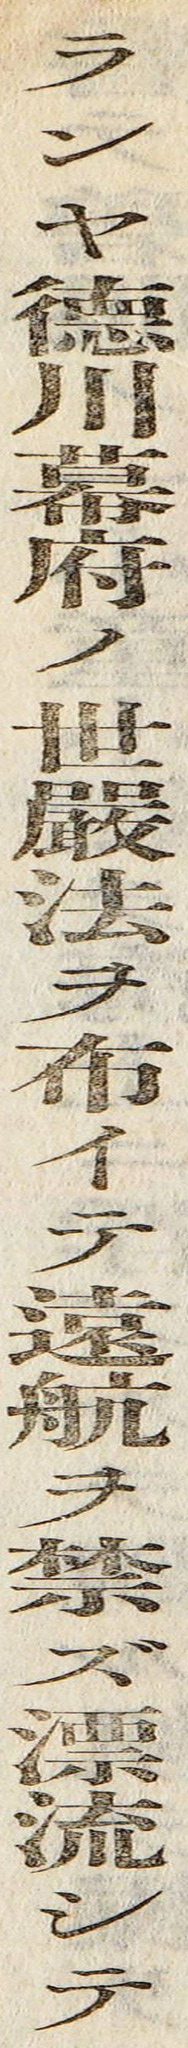ランヤ徳川幕府ノ世厳法ヲ布イテ遠航ヲ禁ズ漂流シテ
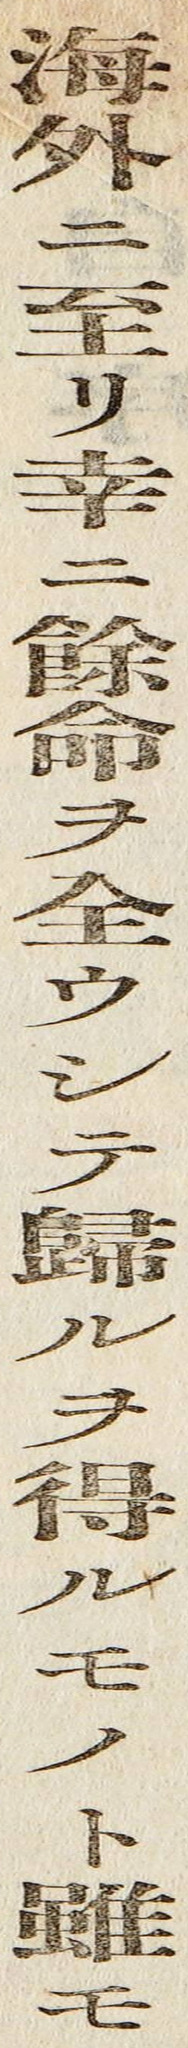海外ニ至リ幸ニ余命ヲ全ウシテ帰ルヲ得ルモノト雖モ
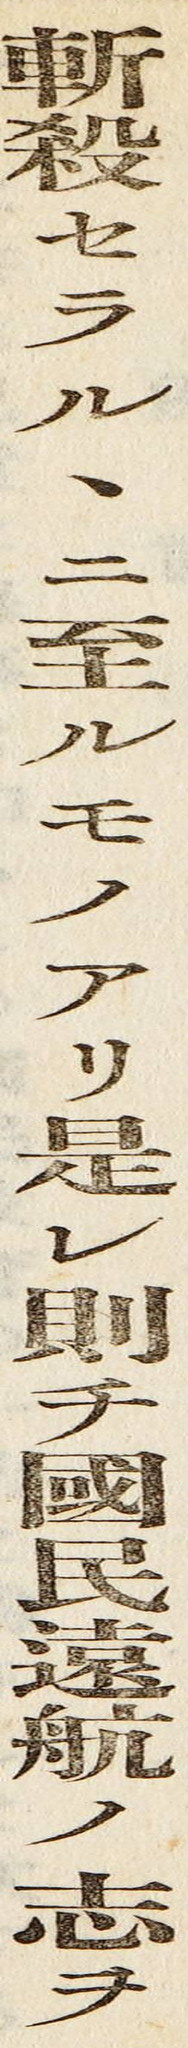斬殺セラルヽニ至ルモノアリ是レ則チ国民遠航ノ志ヲ
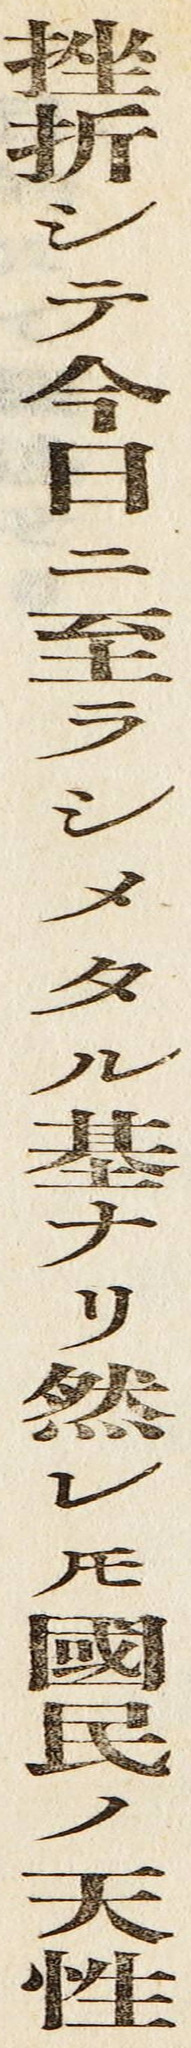挫折シテ今日ニ至ラシメタル基ナリ然レトモ国民ノ天性
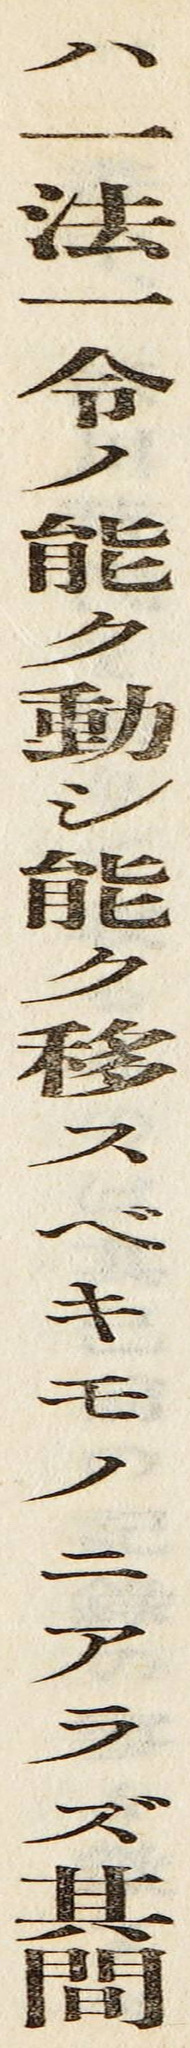ハ一法一令ノ能ク動シ能ク移スベキモノニアラズ其間
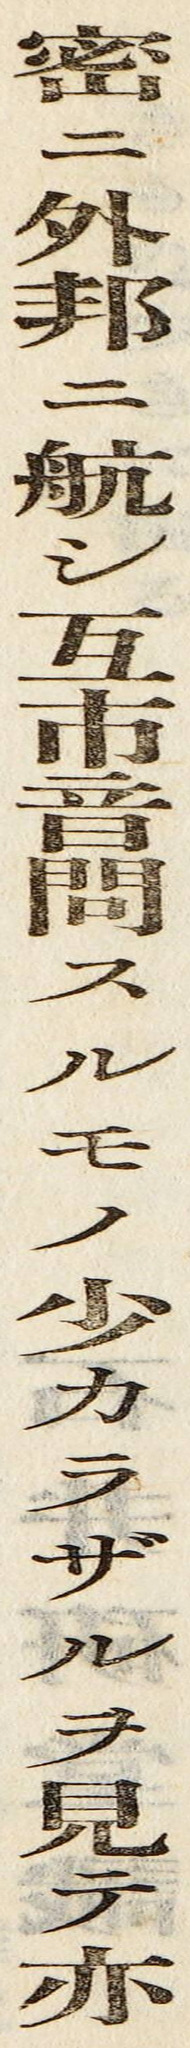密ニ外邦ニ航シ互市音問スルモノ少カラザルヲ見テ亦
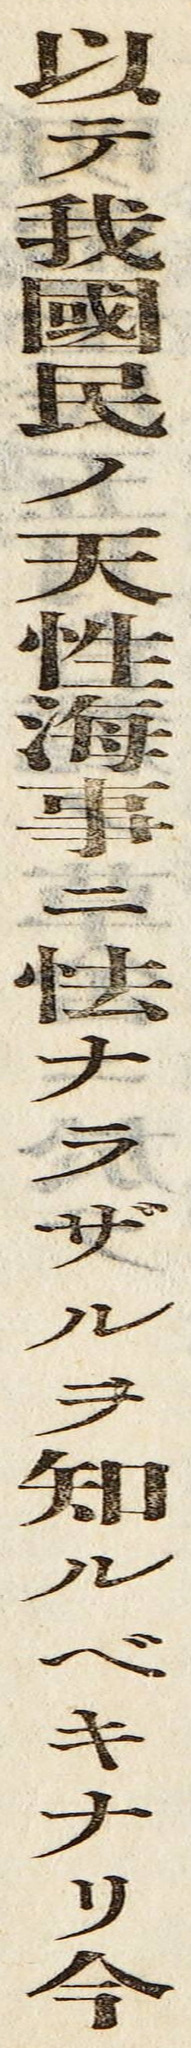以テ我国民ノ天性海事ニ怯ナラザルヲ知ルベキナリ今
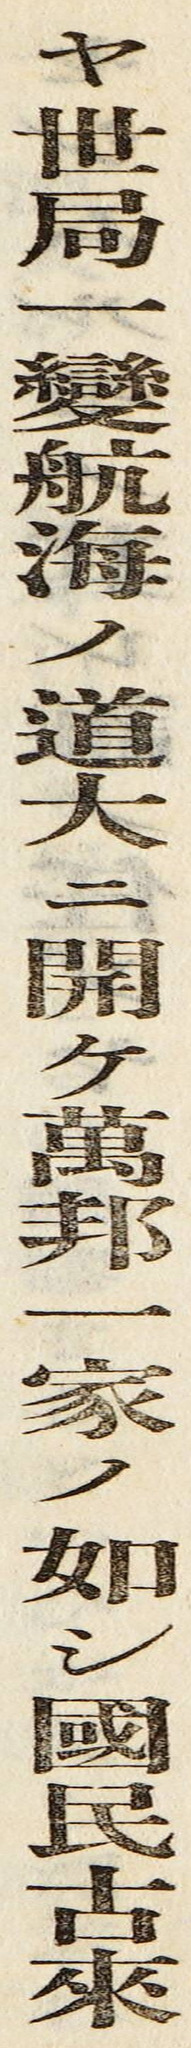ヤ世局一変航海ノ道大ニ開ケ万邦一家ノ如シ国民古来
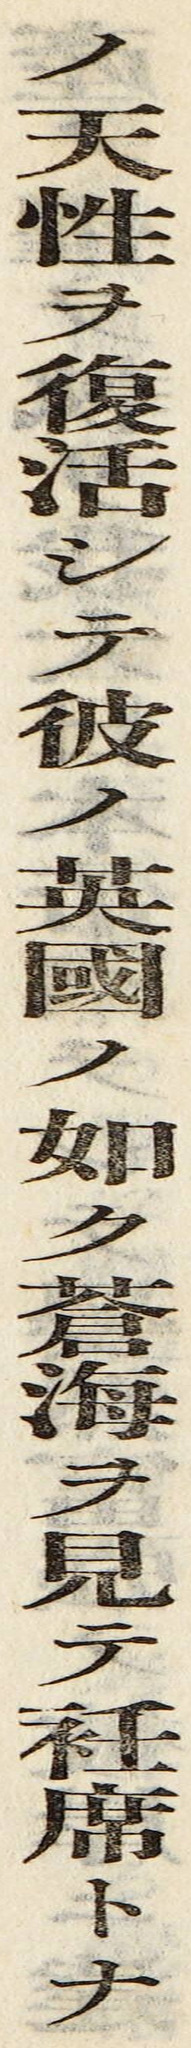ノ天性ヲ復活シテ彼ノ英国ノ如ク蒼海ヲ見テ衽席トナ
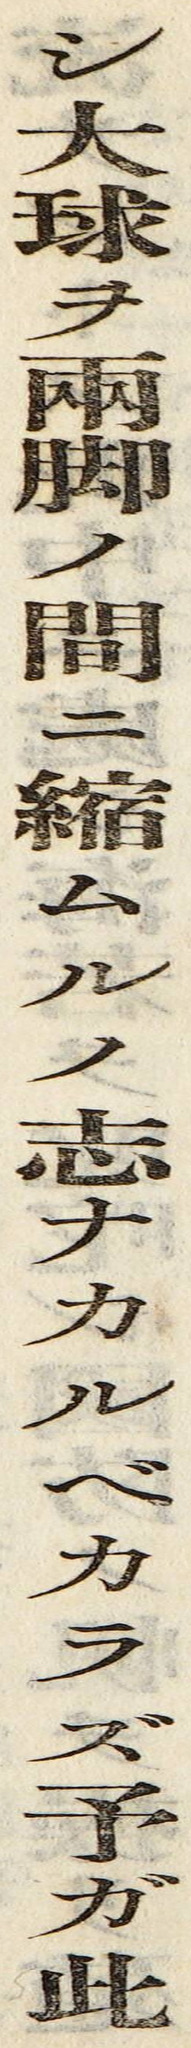シ大球ヲ両脚ノ間ニ縮ムルノ志ナカルベカラズ予ガ此
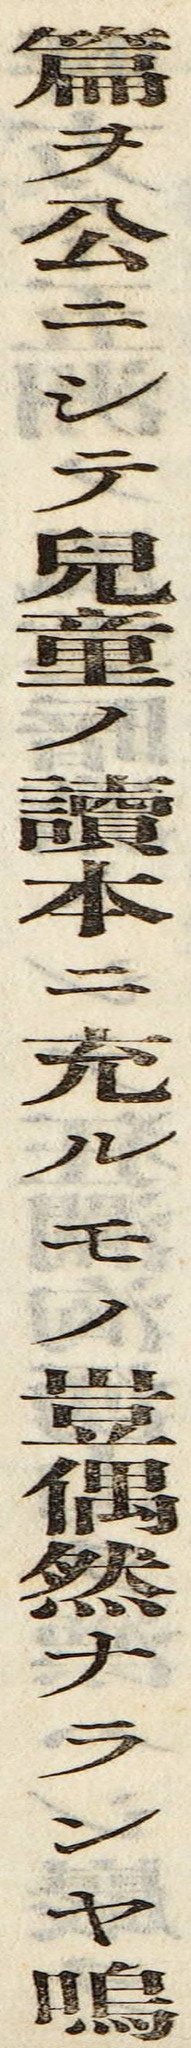篇ヲ公ニシテ児童ノ読本ニ充ルモノ豈偶然ナランヤ鳴

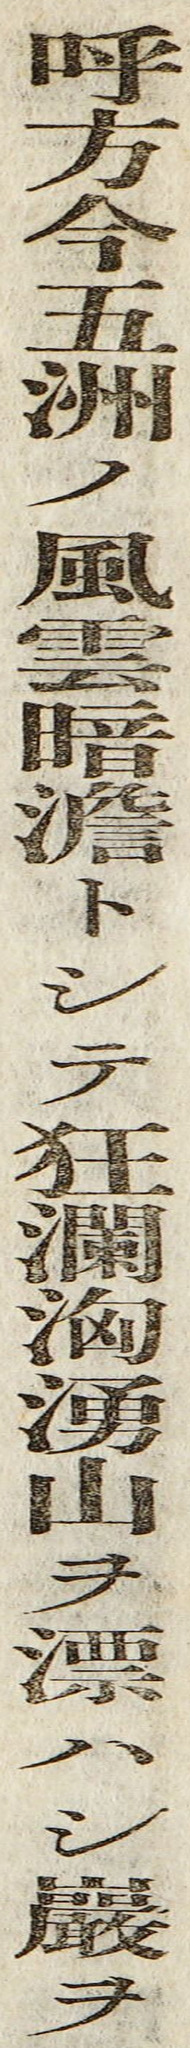呼方今五洲ノ風雲暗澹トシテ狂瀾洶湧山ヲ漂ハシ巌ヲ
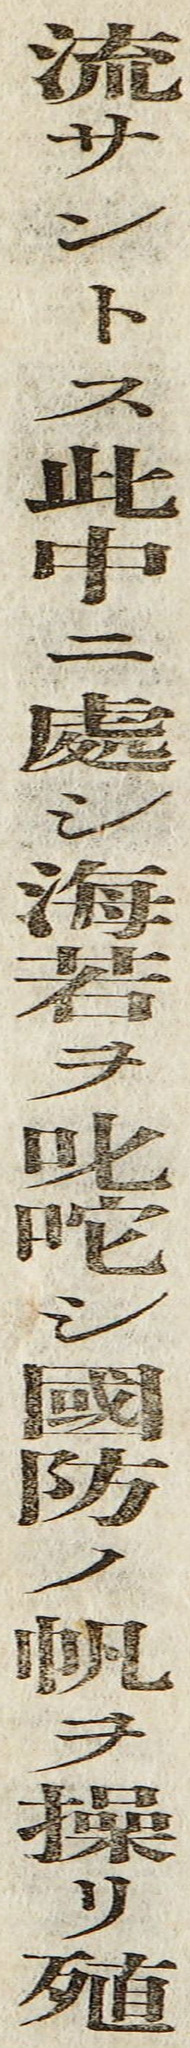流サントス此中ニ処シ海若ヲ叱咤シ国防ノ帆ヲ操リ殖
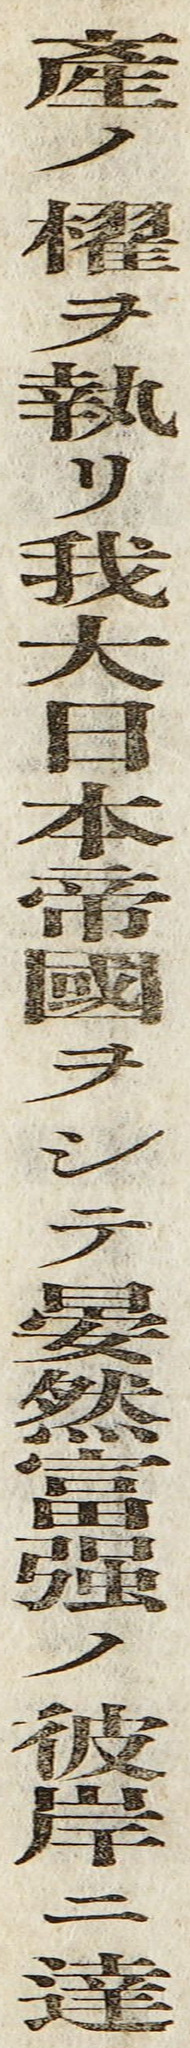産ノ櫂ヲ執リ我大日本帝国ヲシテ晏然富強ノ彼岸ニ達
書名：日本漂流譚
